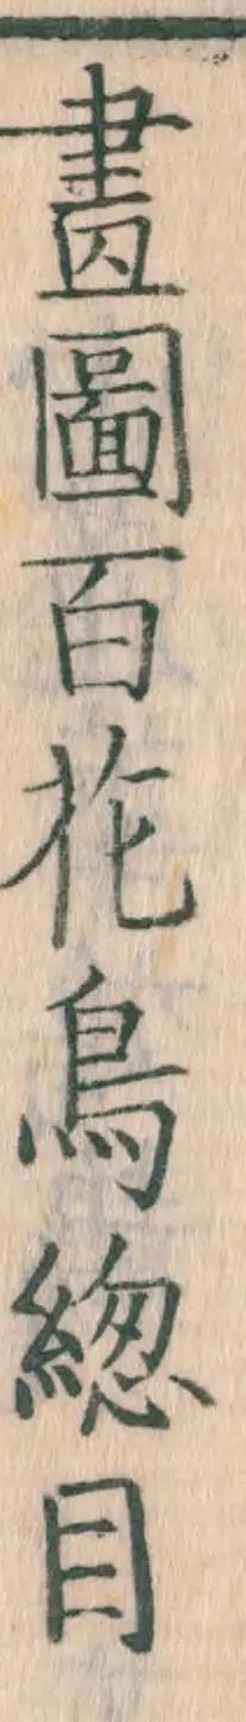画図百花鳥総目
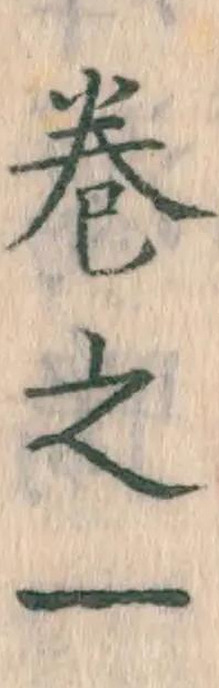巻之一
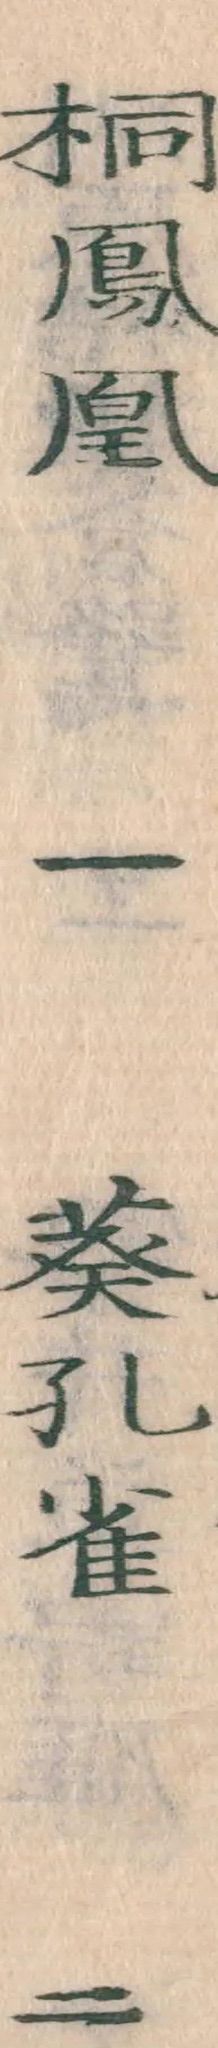桐鳳凰一葵孔雀二
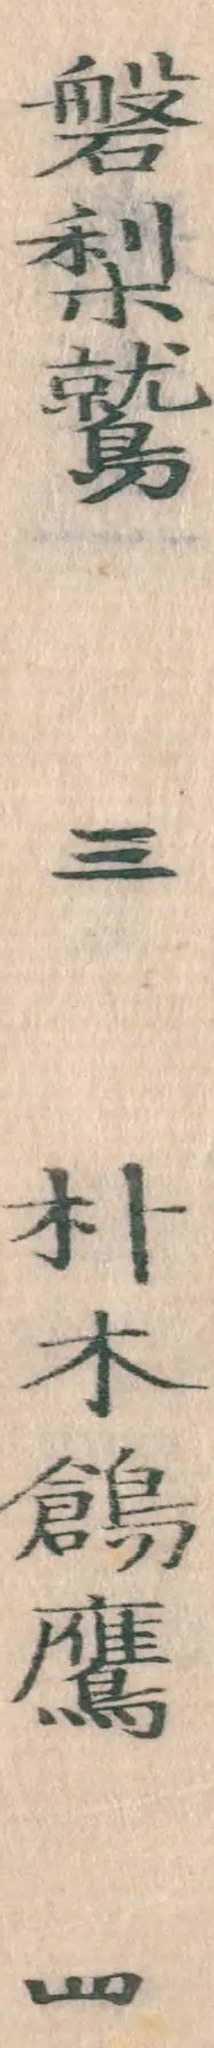磐梨鷲三朴木鶬鷹四
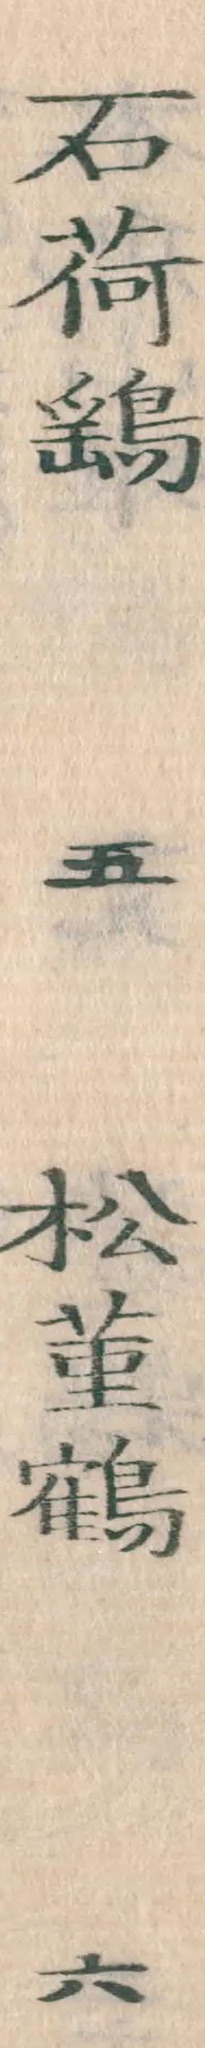石荷鷂五松菫鶴六
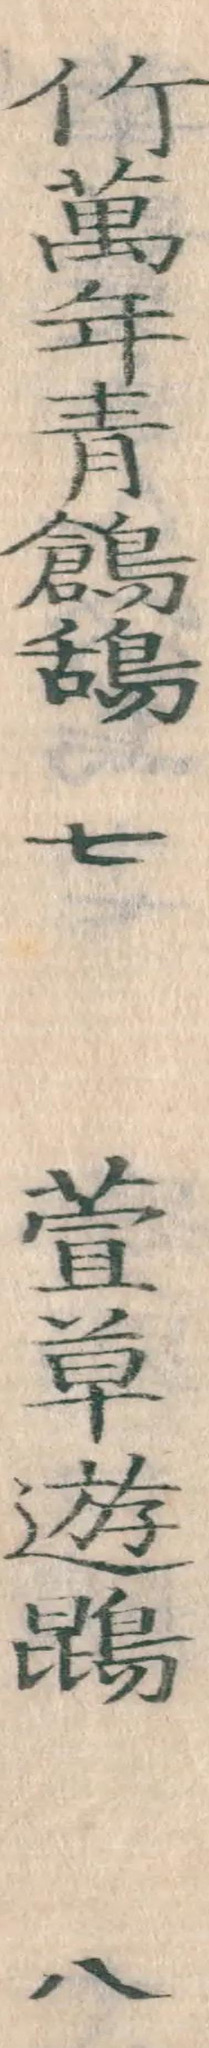竹万年青鶬鴰七萱草遊鵾八
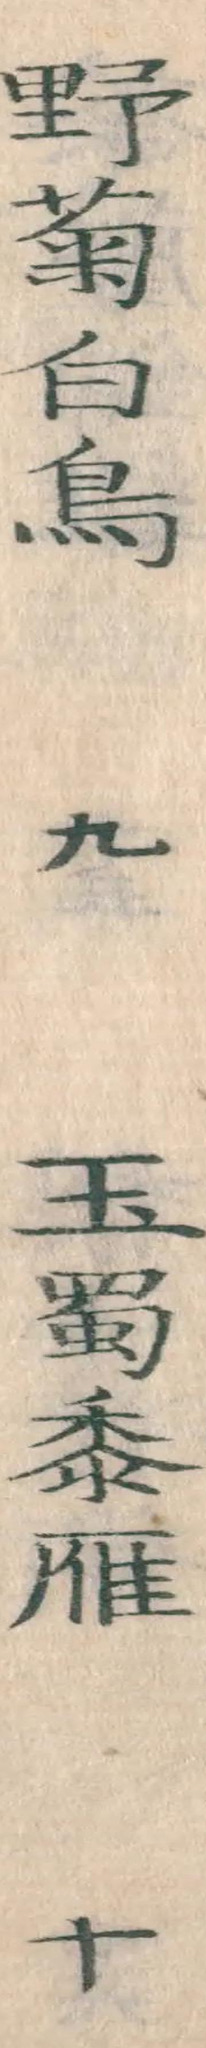野菊白鳥九玉蜀黍雁十

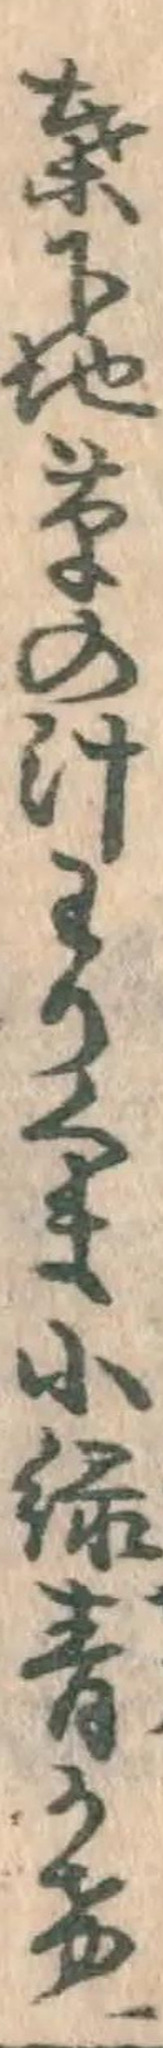葉下地草の汁わりくま小緑青うす
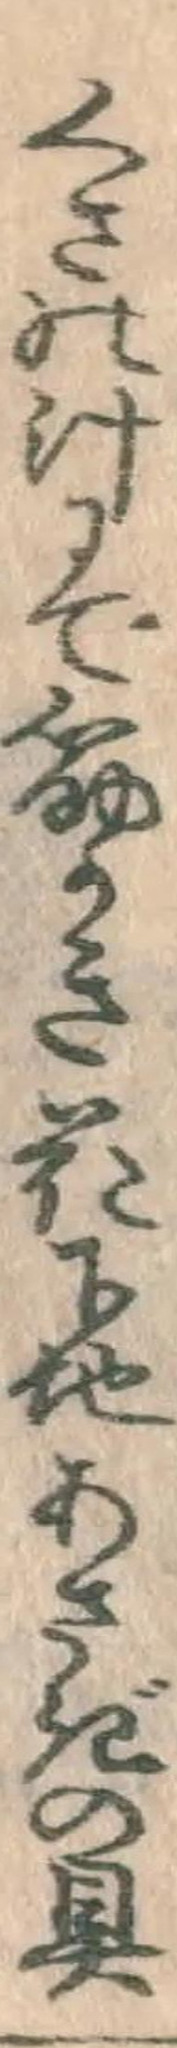くさの知るにでうき花下地あさぎの具
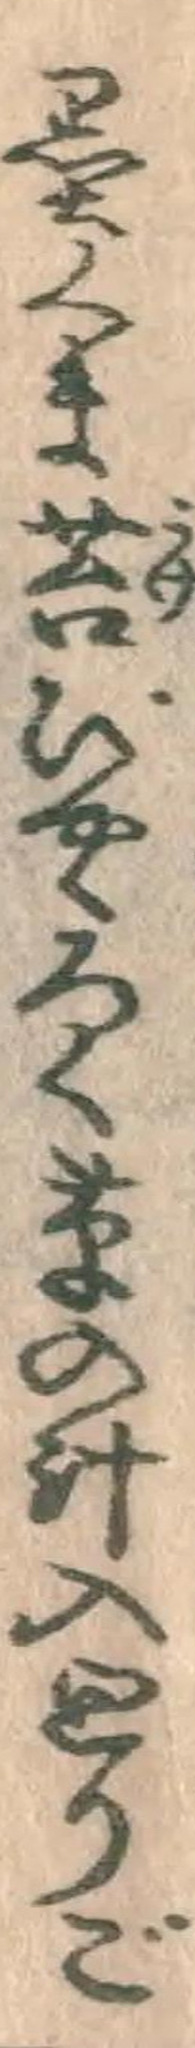黒くま苔びやくろく草の汁入れとりご
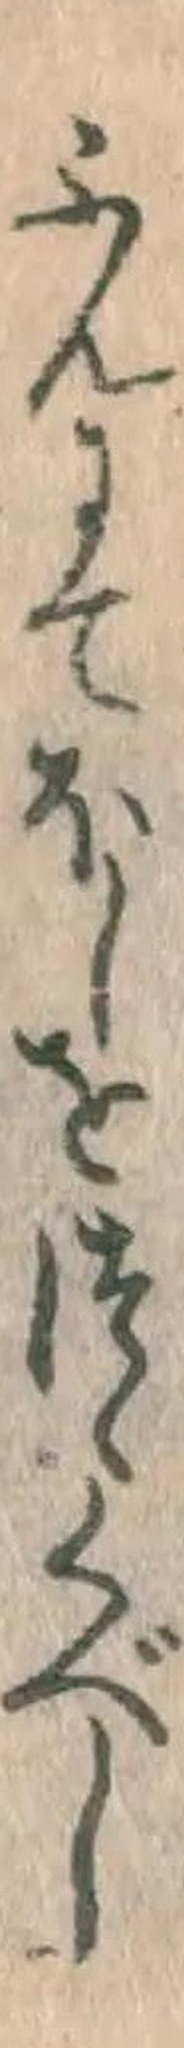ふんにてほしをくべし

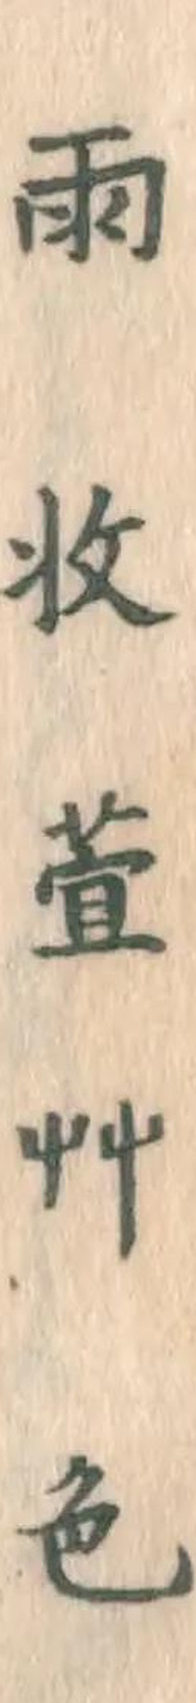雨収萱艸色
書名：畫圖百花鳥 5巻. [1]
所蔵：国立国会図書館 National Diet Library, JAPAN
